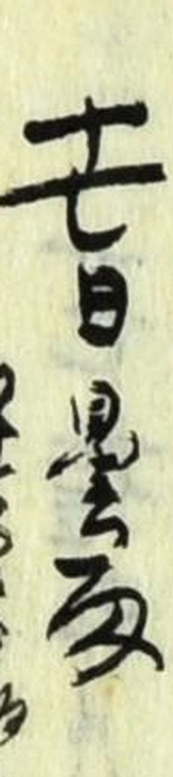十七日曇雨
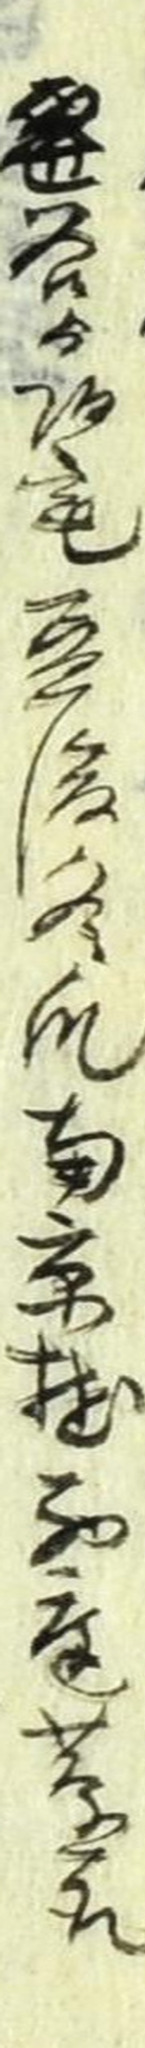笹谷ゟ帰宅昼後冬瓜南京植西庭草取
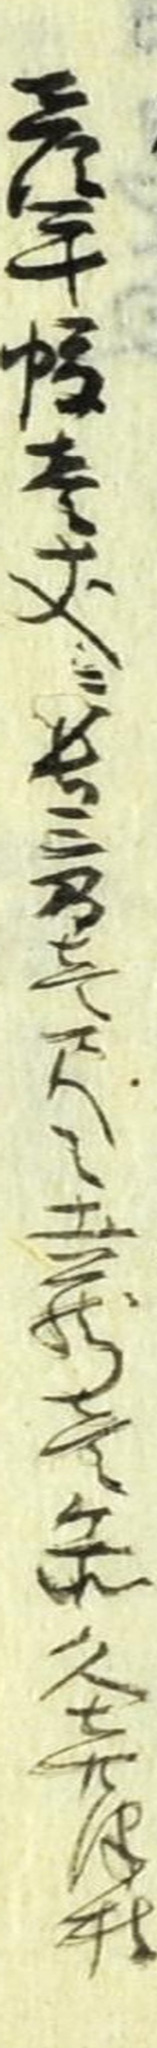彦平幅壱丈ニ長三間壱尺之土蔵壱ヶ所久喜津村
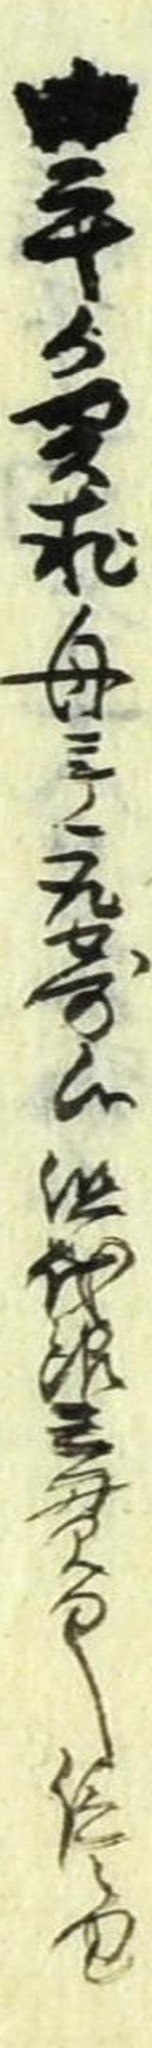平ゟ買求舟ニテ取寄候但代銀三貫匁位之由
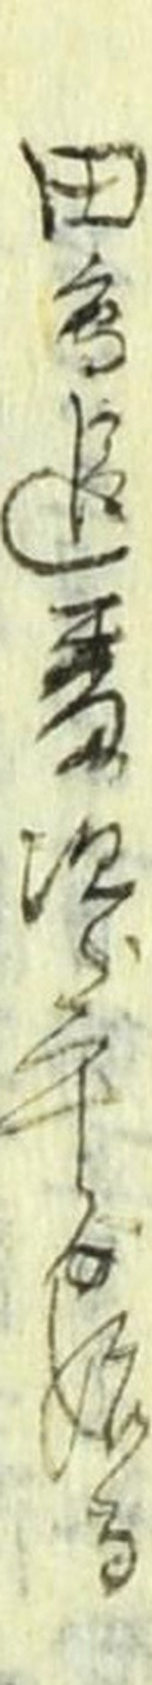田鳥追番次郎平ゟ始る
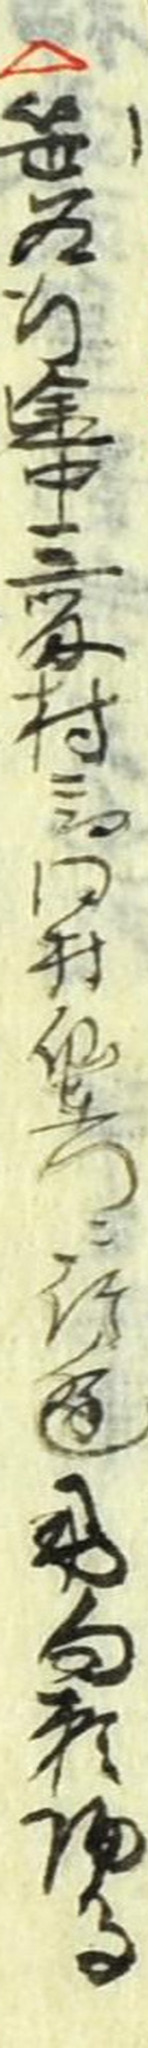笹谷行途中三留村ニ而同村仙在門ニ行逢用向頼帰る
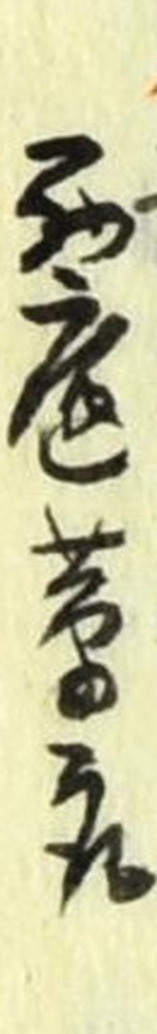西庭草取

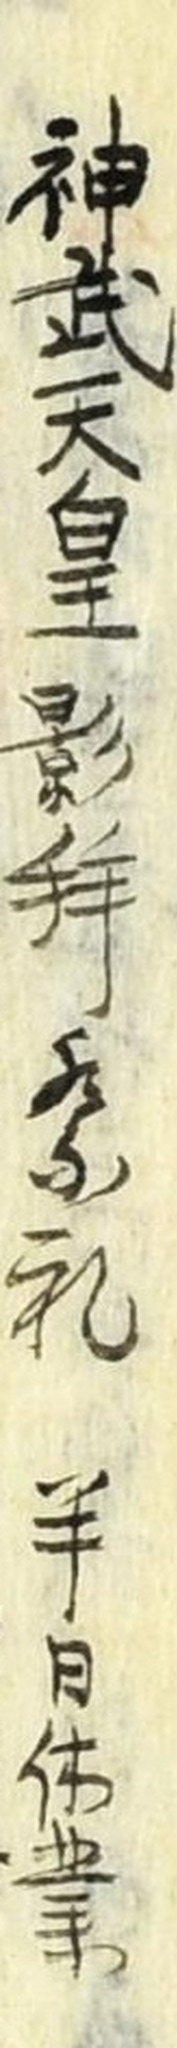神武天皇影拝祭礼半日休業
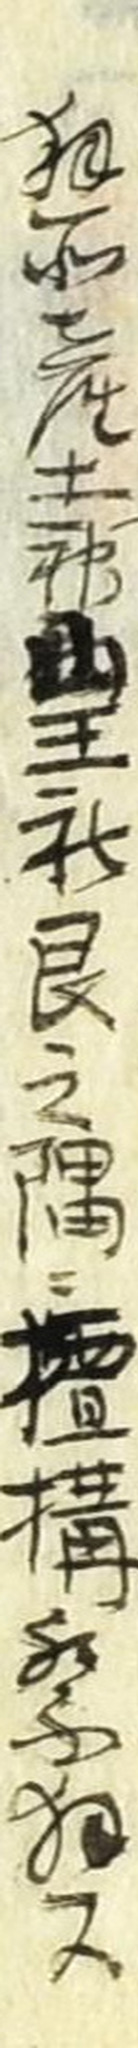拝所産土神山王社艮之隅丹檀構祭拝ス
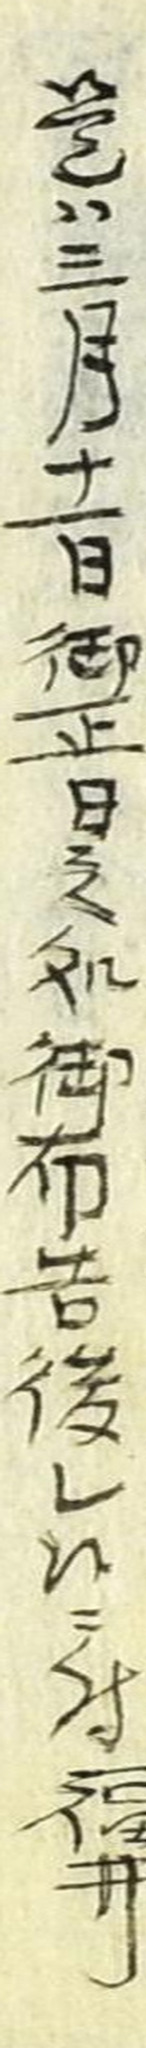是ハ三月十一日御正日之処御布告後レ候ニ付福井
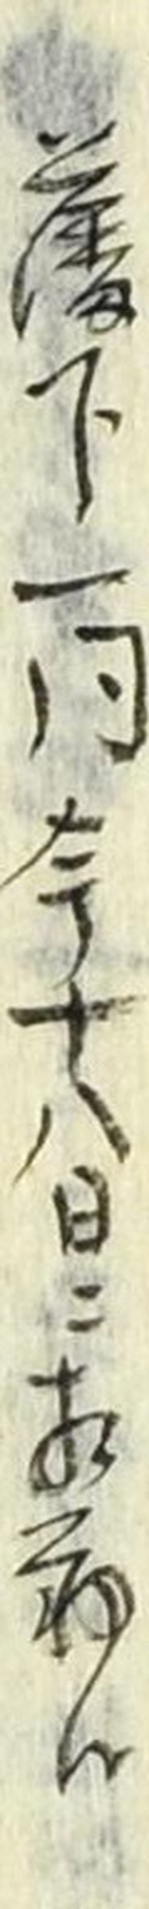藩下一同今十八日ニ相勤候
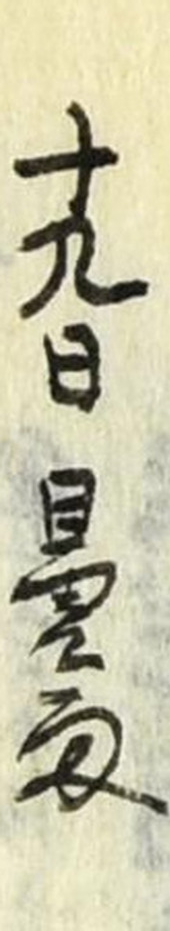十九日曇雨
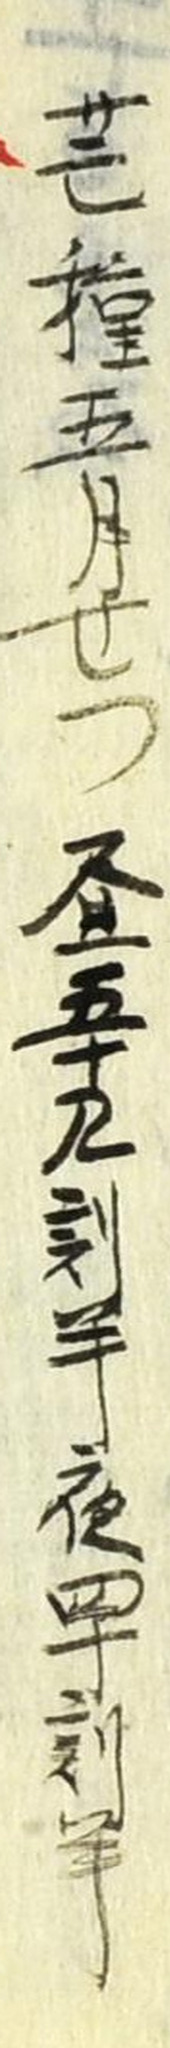芒種五月せつ昼五十九刻半夜四十刻半
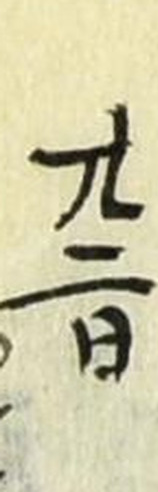廿二日
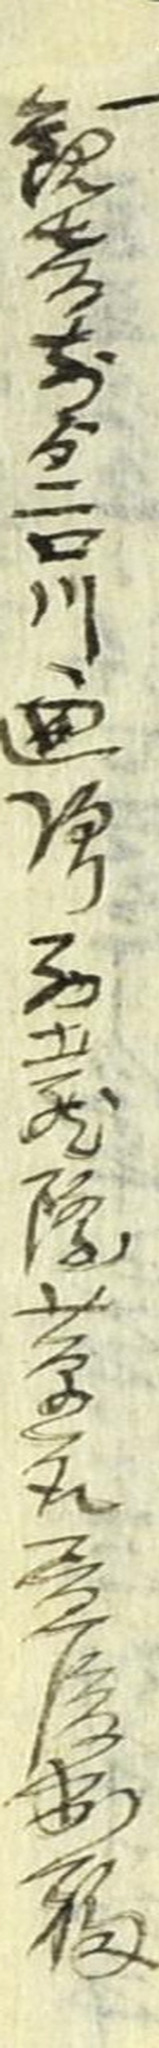観音前ゟ二口川へ廻帰リ西土蔵際草取昼後出福
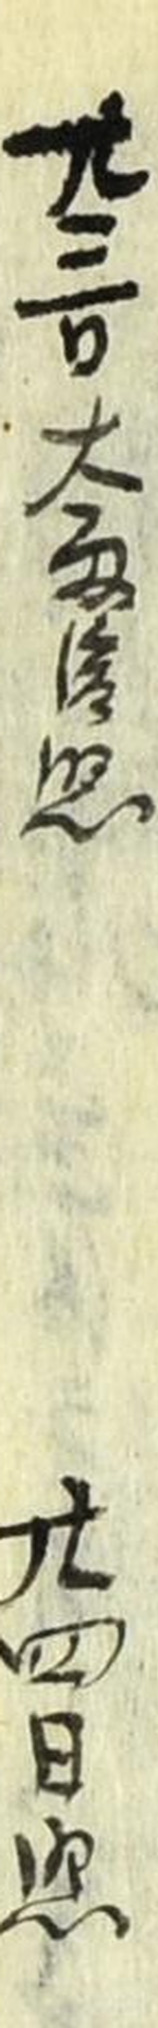廿三日大雨後照廿四日照
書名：（日記）
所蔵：福井県文書館 Fukui Prefectural Archives
